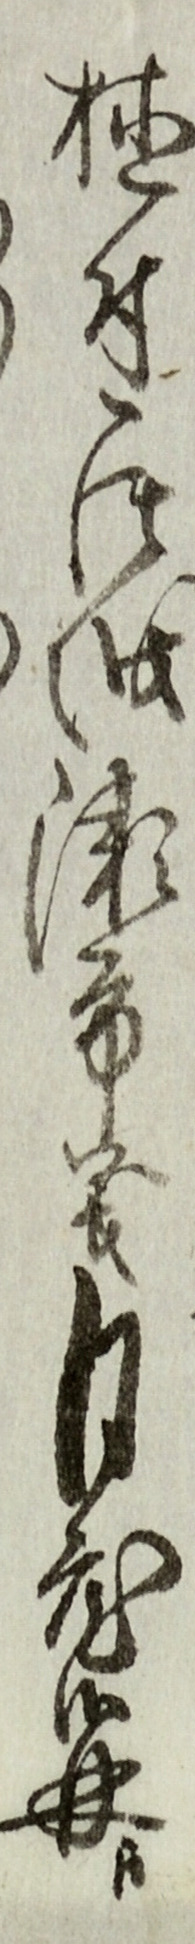植付罷越瀬市義月蔵御林江
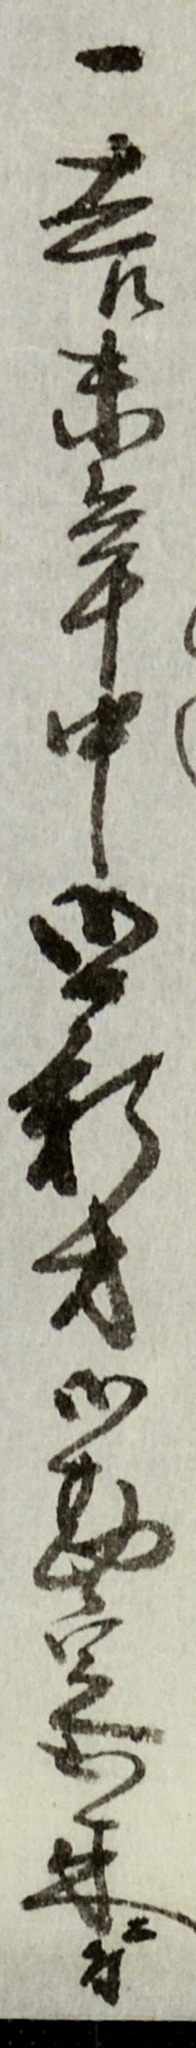一去ル未年中御薪方御勘定出来ニ付

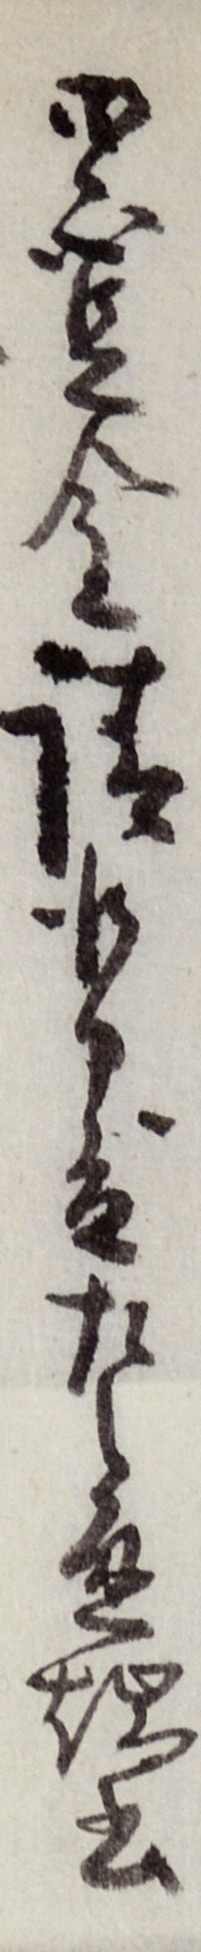御不足金請取申度左之通端書
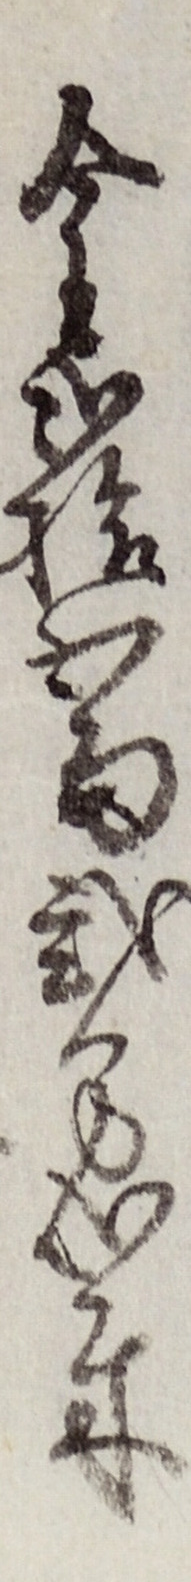金弐拾五両弐分弐朱
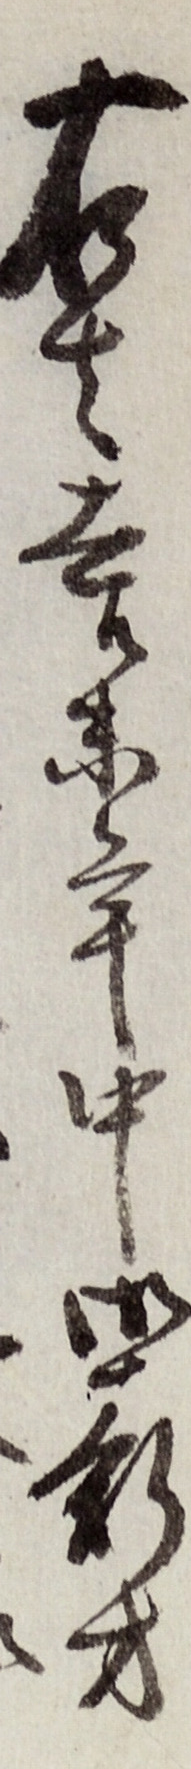右者去ル未年中御薪方
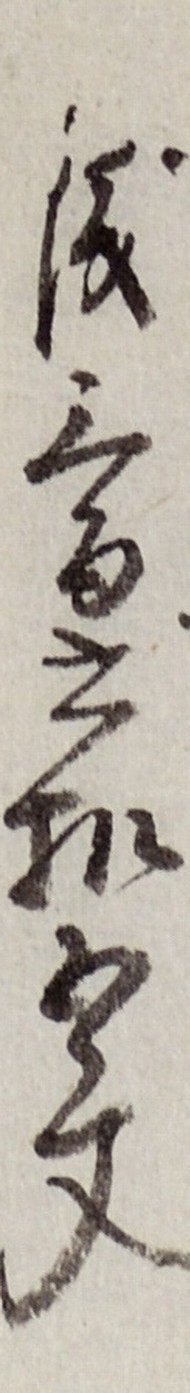銭三百六拾五文
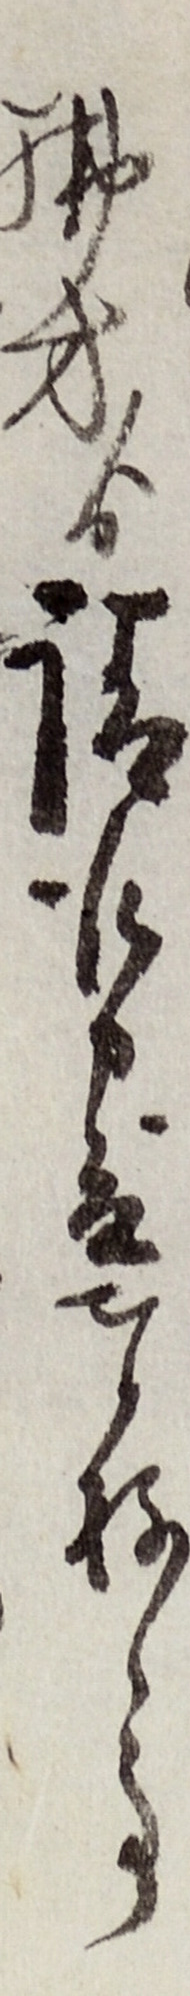払方ゟ請取申度奉存候事
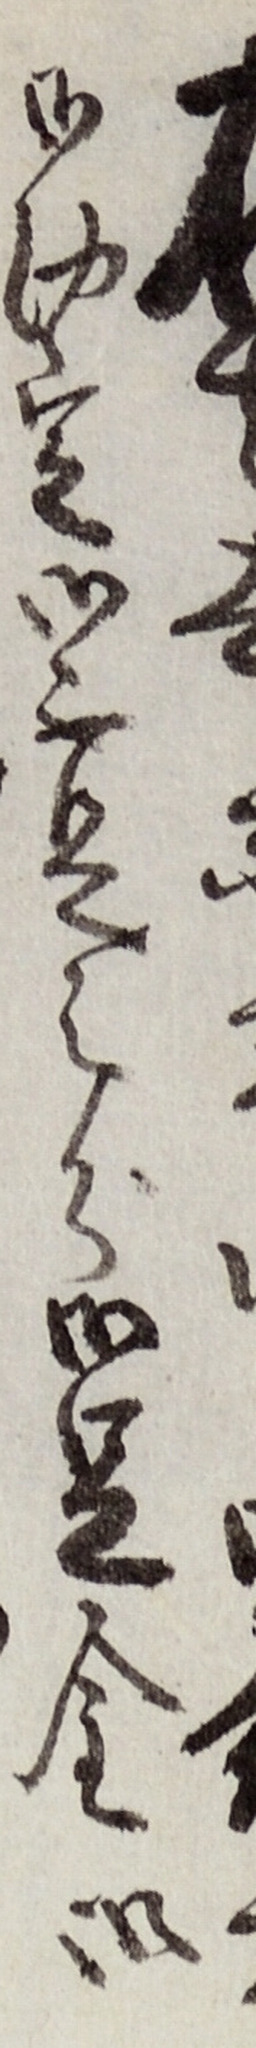御勘定不足之分御足金御
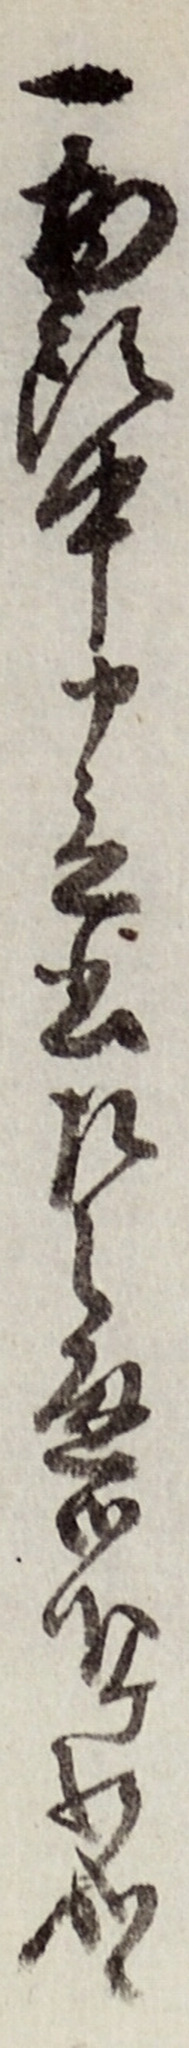一物頭中申立書左之通御下ケ相成候
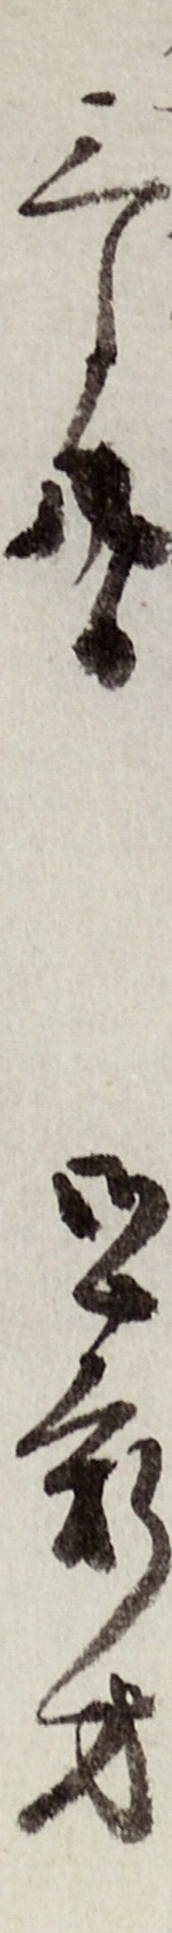三月八日御薪方
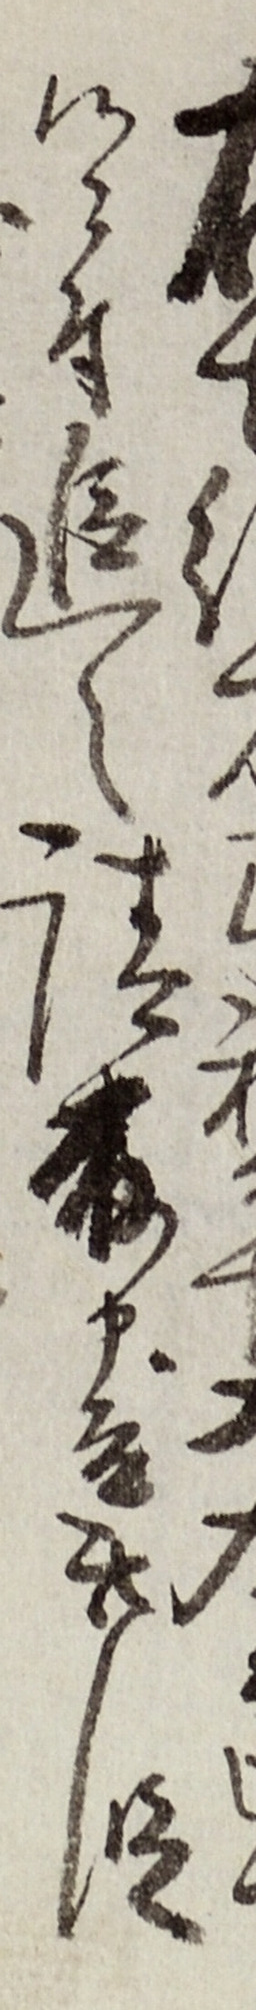候ニ付追々請取申度此段
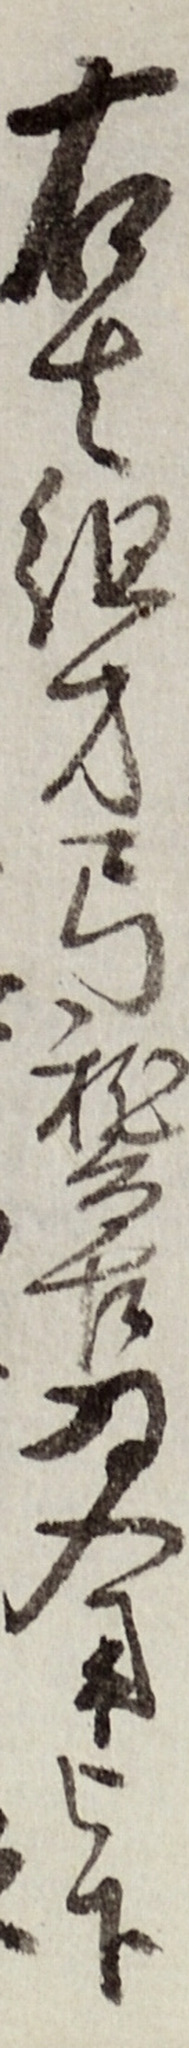右者組方弓稽古為入用被下
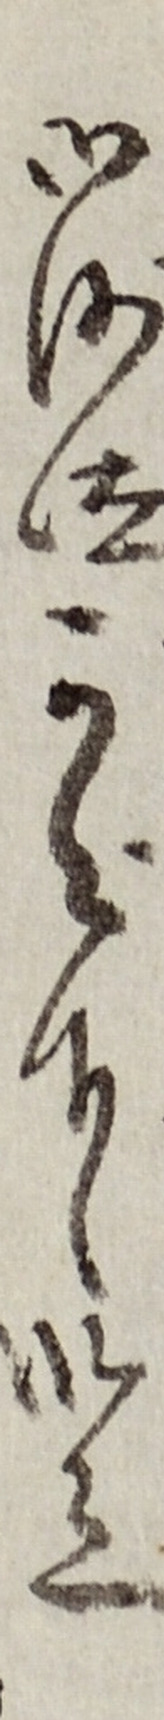御沙汰可被下候以上
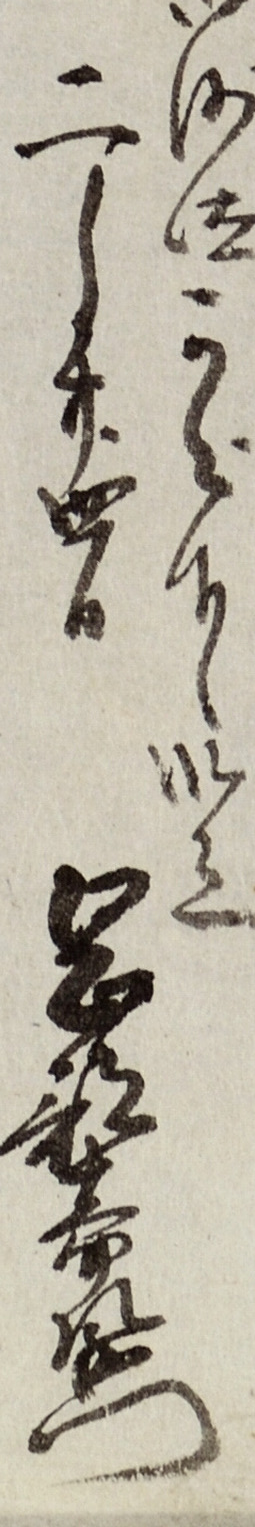二月廿四日岡部嘉左衛門
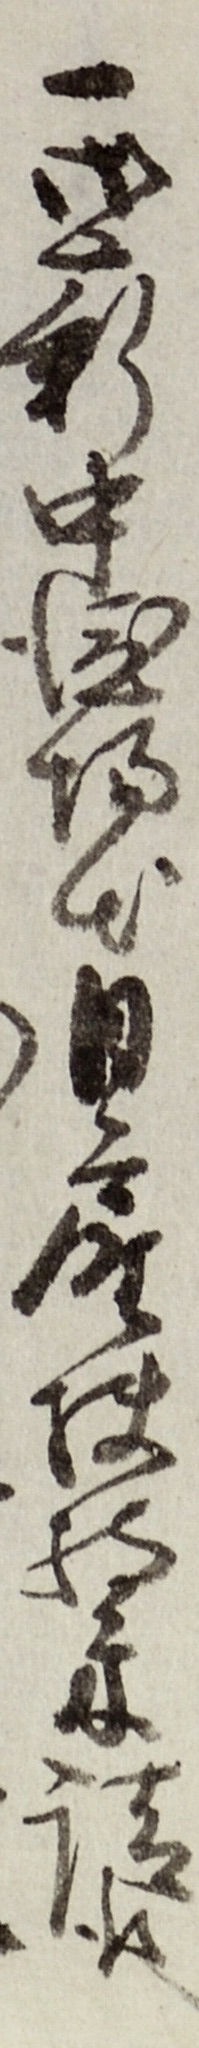一御薪中渡場出日雇扶持米請取
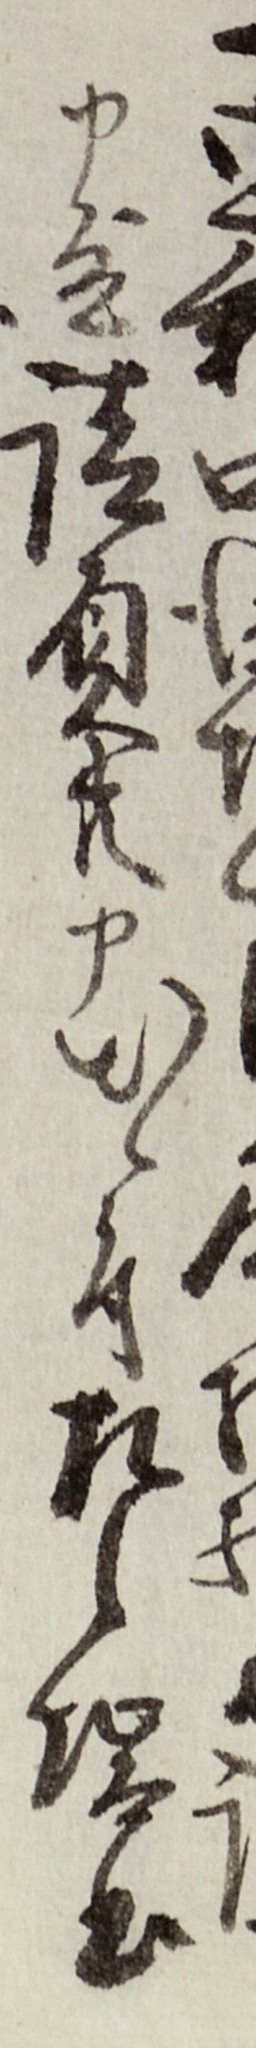申度請負共申出候ニ付左之端書
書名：御山方御薪方諸事御用留
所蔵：伊那市立高遠町図書館・合同会社AMANE
